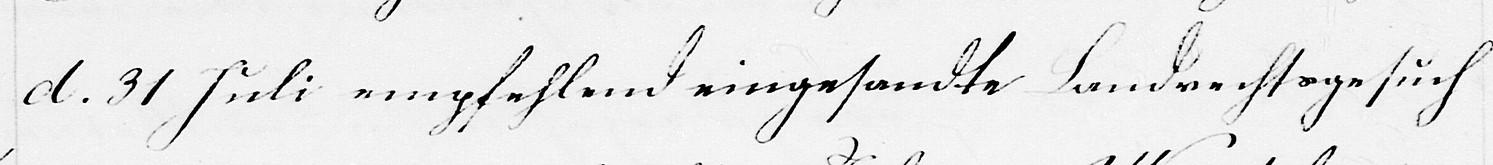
d. 31 Juli empfehlend eingesandte Landrechtsgesuch
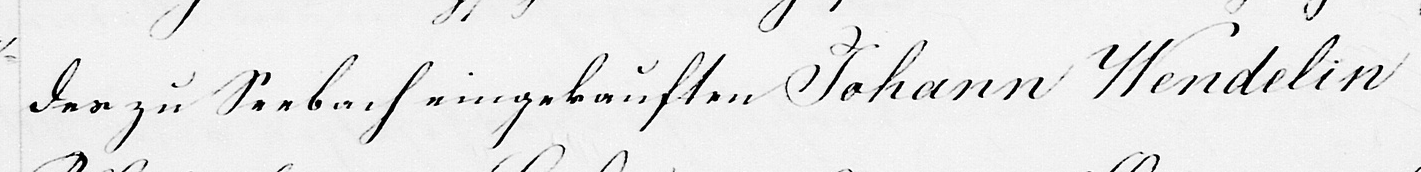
des zu Seebach eingekauften Johann Wendelin
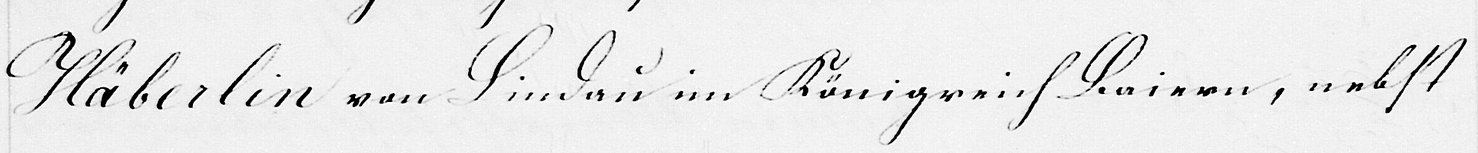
Häberlin von Lindau im Königreich Baiern, nebst
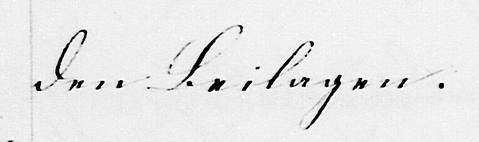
den Beilagen.
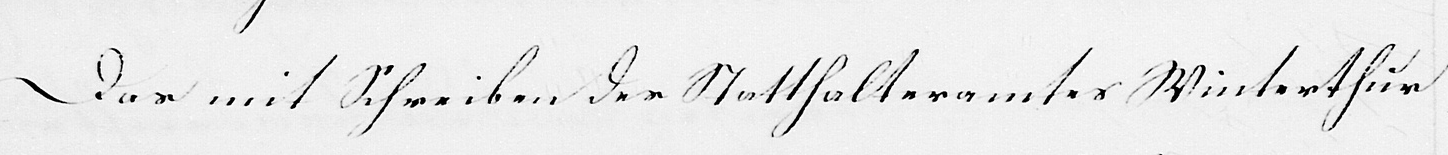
Das mit Schreiben des Statthalteramtes Winterthur
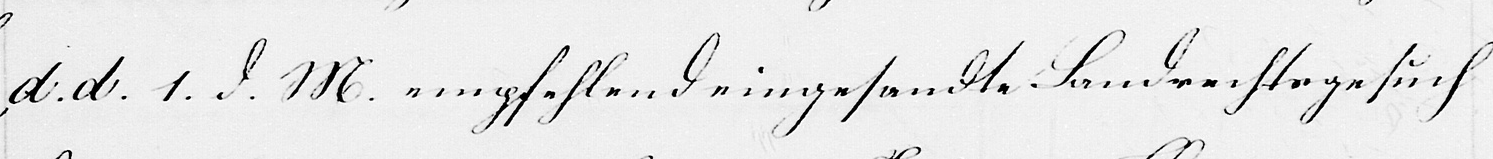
d. d. 1. d. M. empfehlend eingesandte Landrechtsgesuch
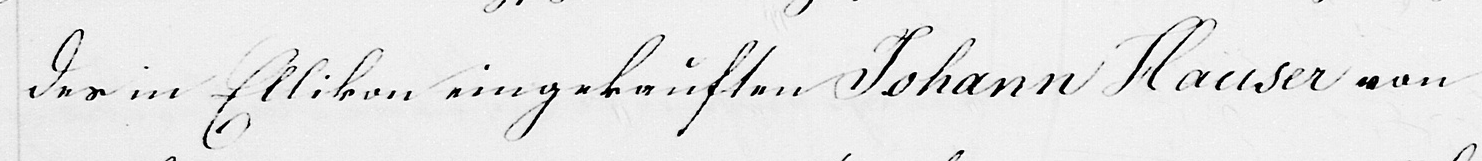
des in Ellikon eingekauften Johann Hauser von
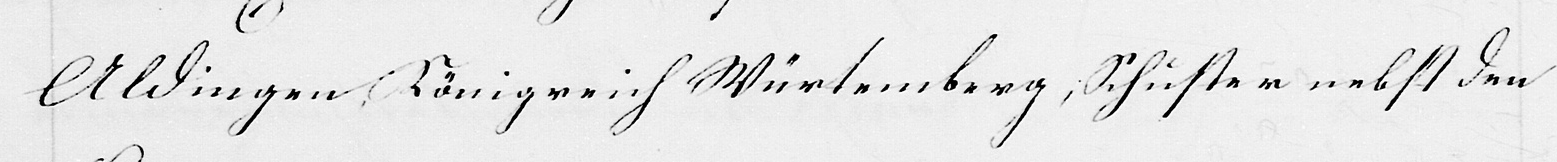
Aldingen Königreich Würtemberg, Schuster nebst den
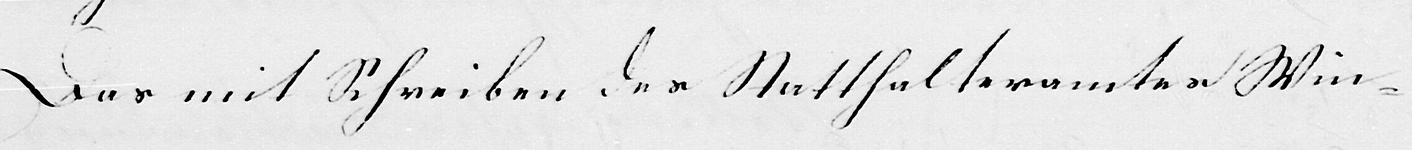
Das mit Schreiben des Statthalteramtes Win-
